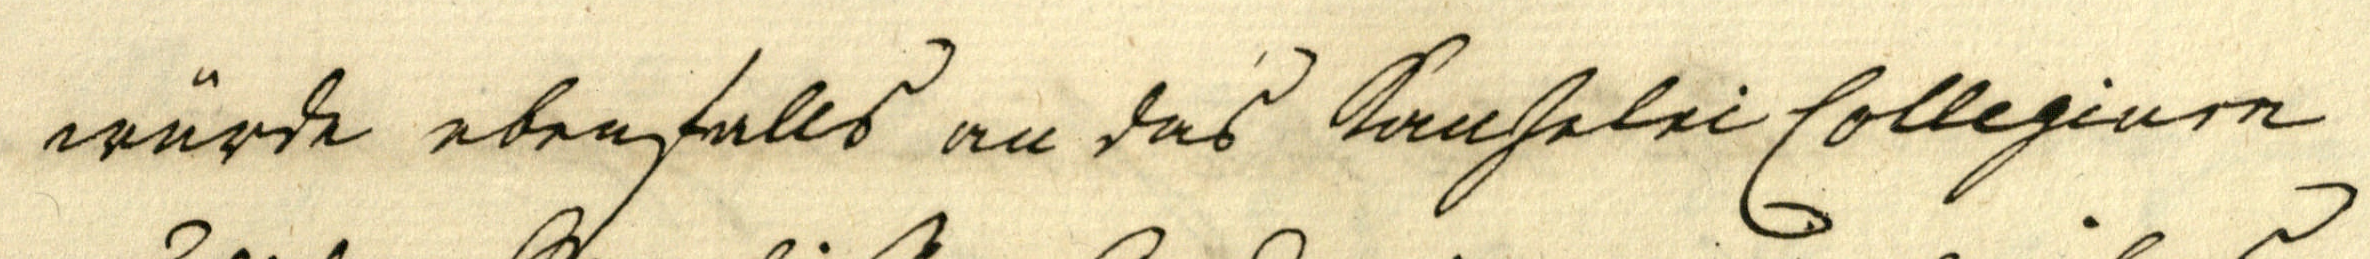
würde ebenfalls an das Kanzelei Collegium
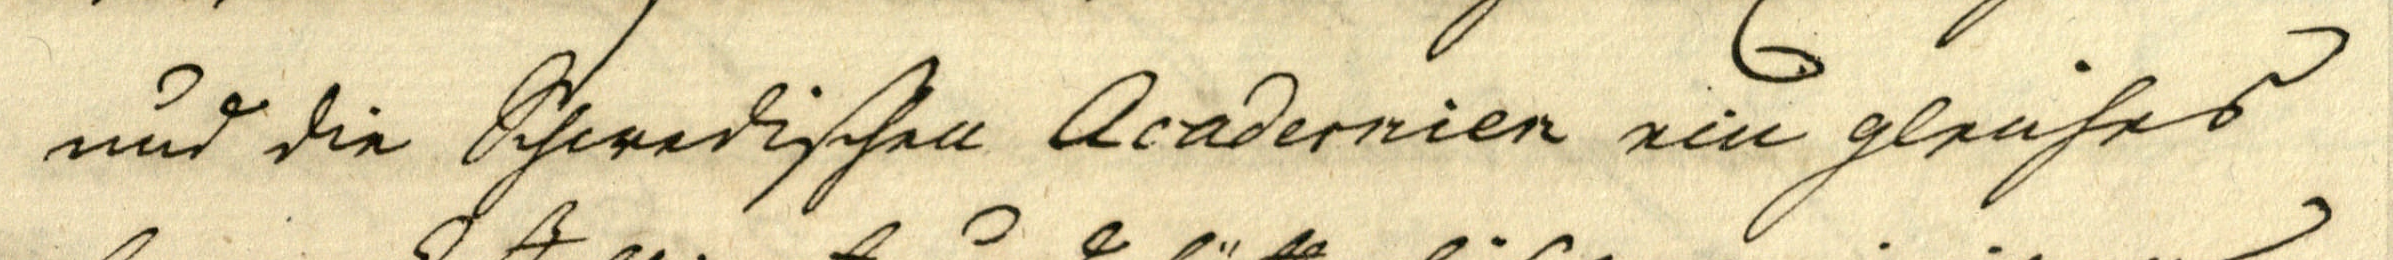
und die Schwedischen Academien ein gleiches
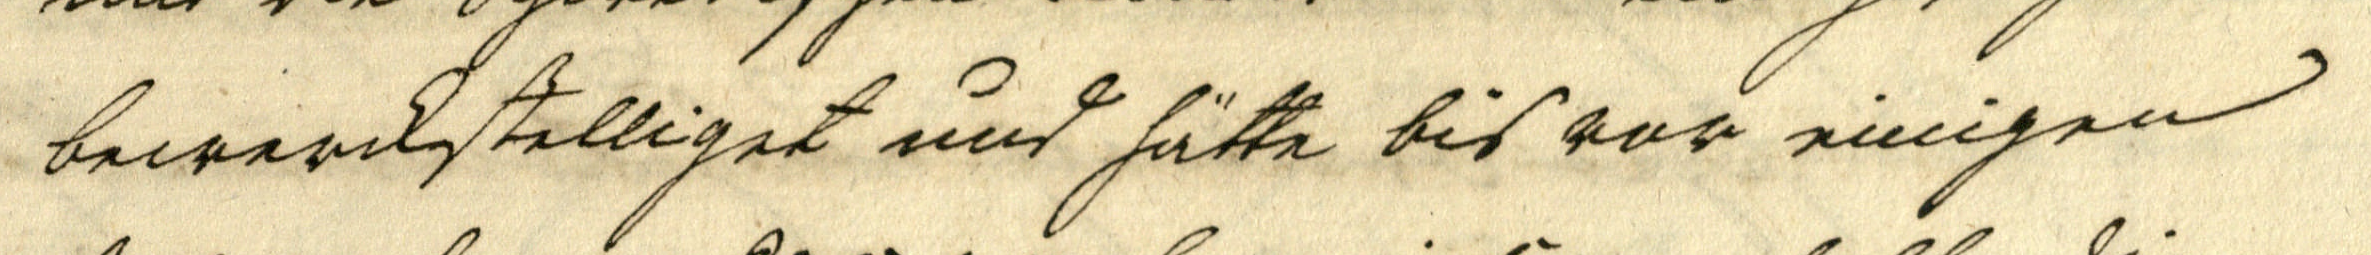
bewerkstelliget und hätte bis vor einigen
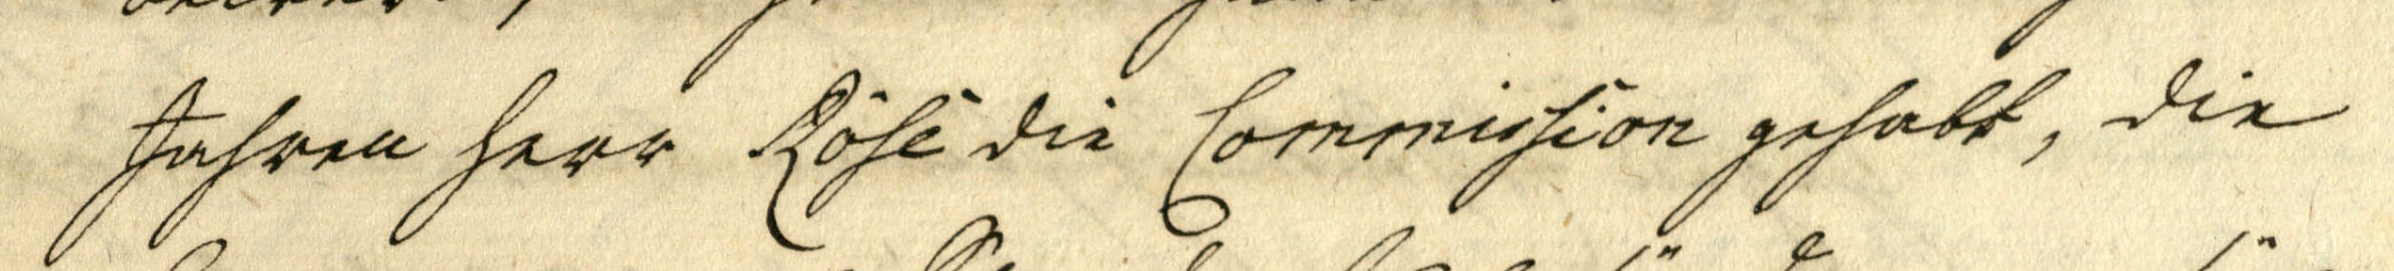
Jahren Herr Röse die Commission gehabt, die
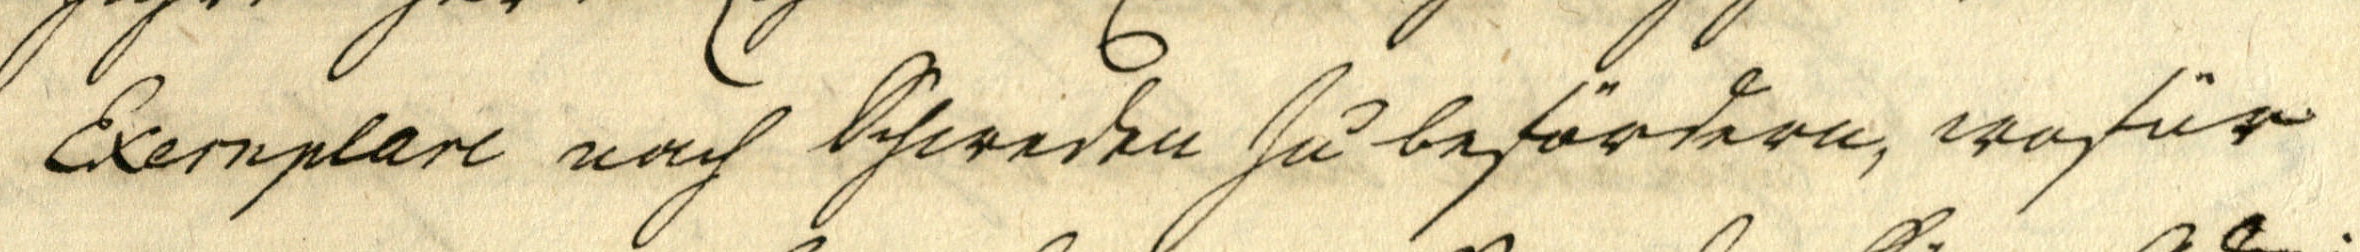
Exemplare nach Schweden zu befördern, wofür
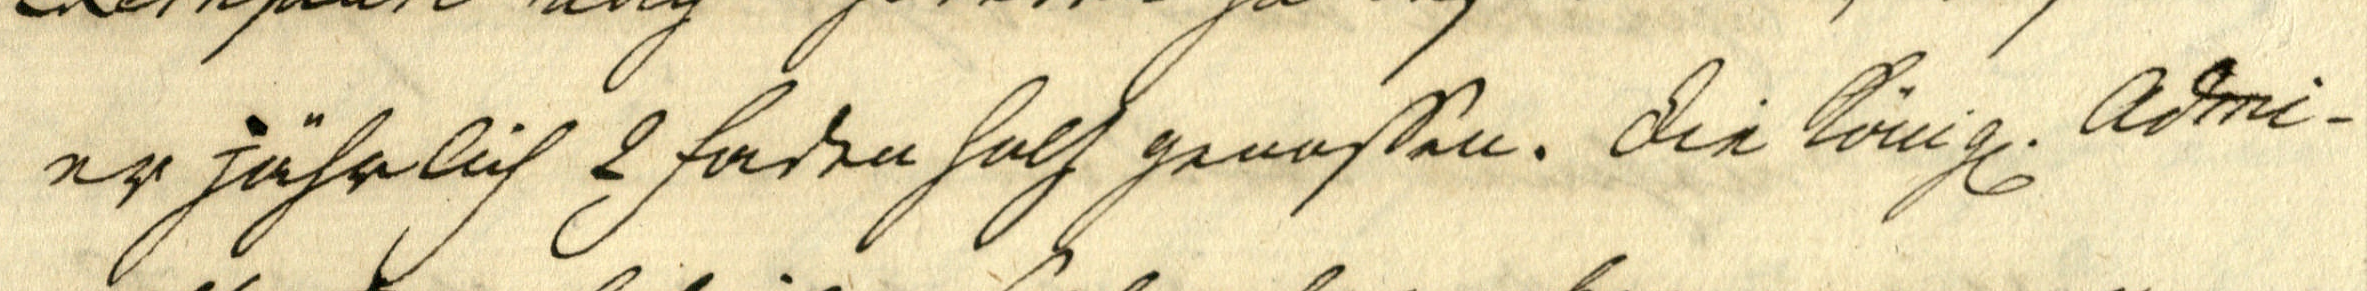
er jährlich 2 faden holz genossen. Die Königl. Admi-
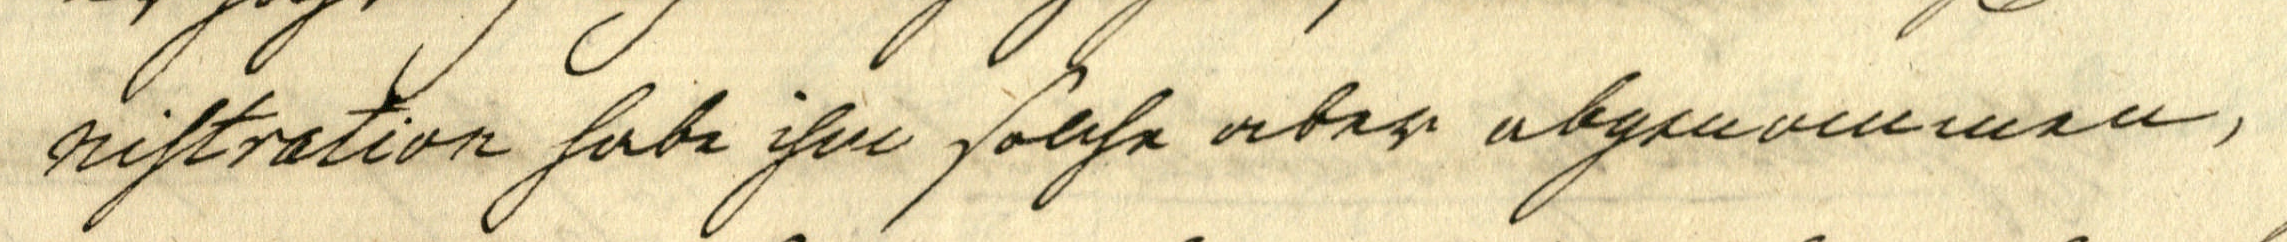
nistration habe ihm solche aber abgenommen,
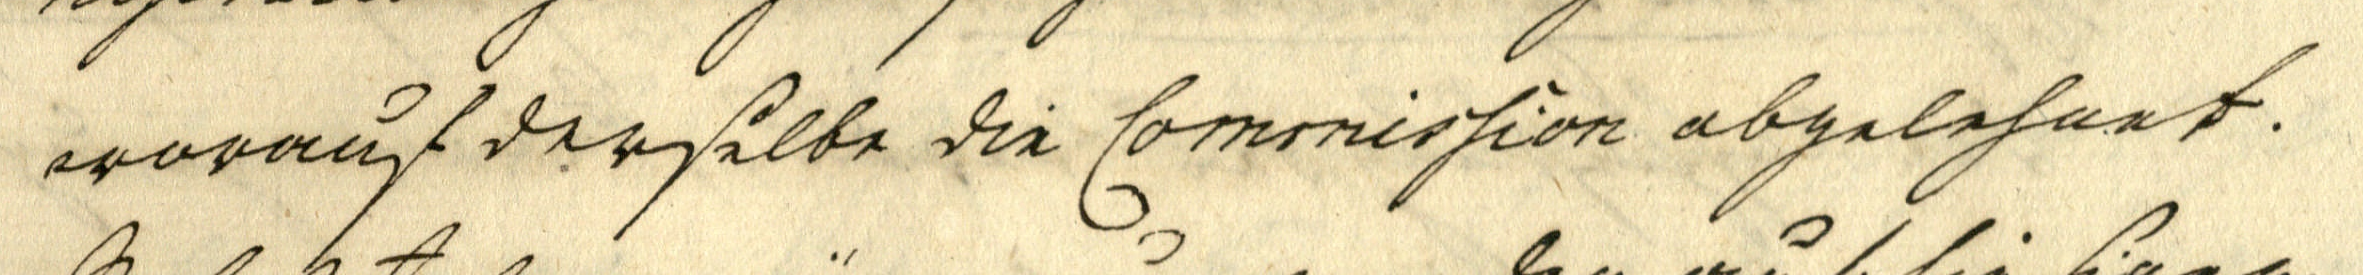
worauf derselbe die Commission abgelehnet.
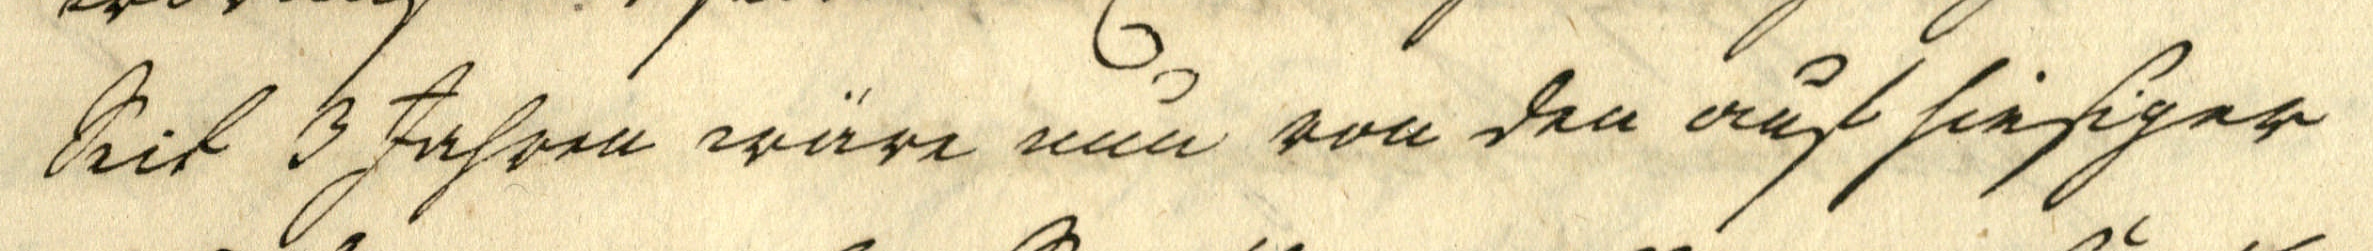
Seit 3 Jahren wäre nun von den auf hiesiger
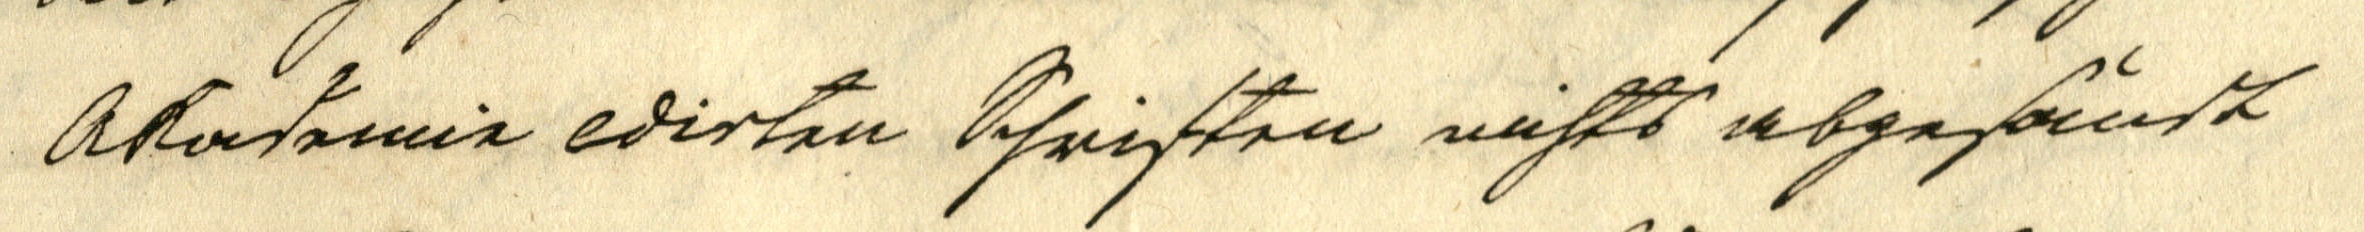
Akademie edirten Schriften nichts abgesandt
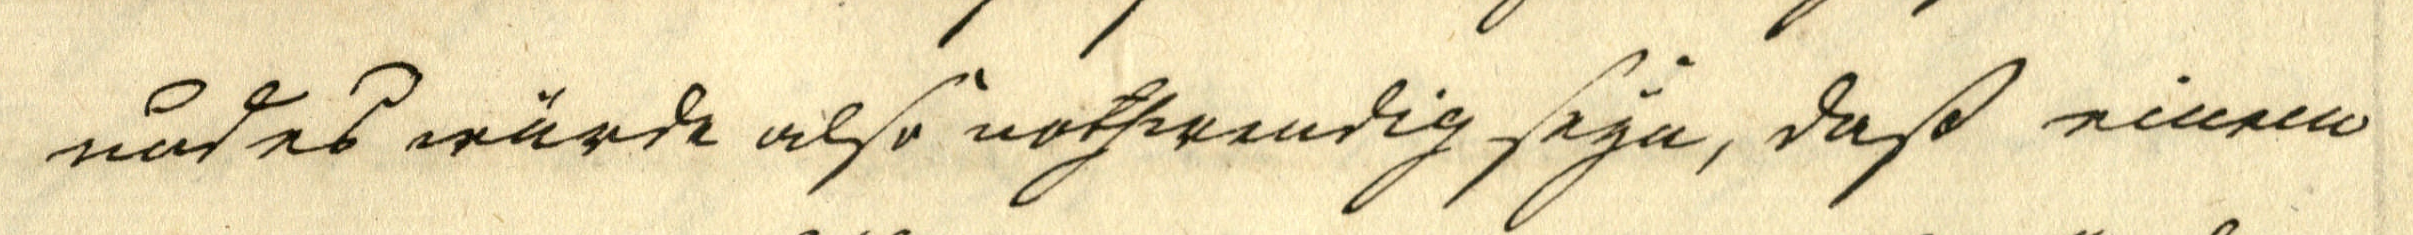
und es würde also nothwendig seyn, daß einem
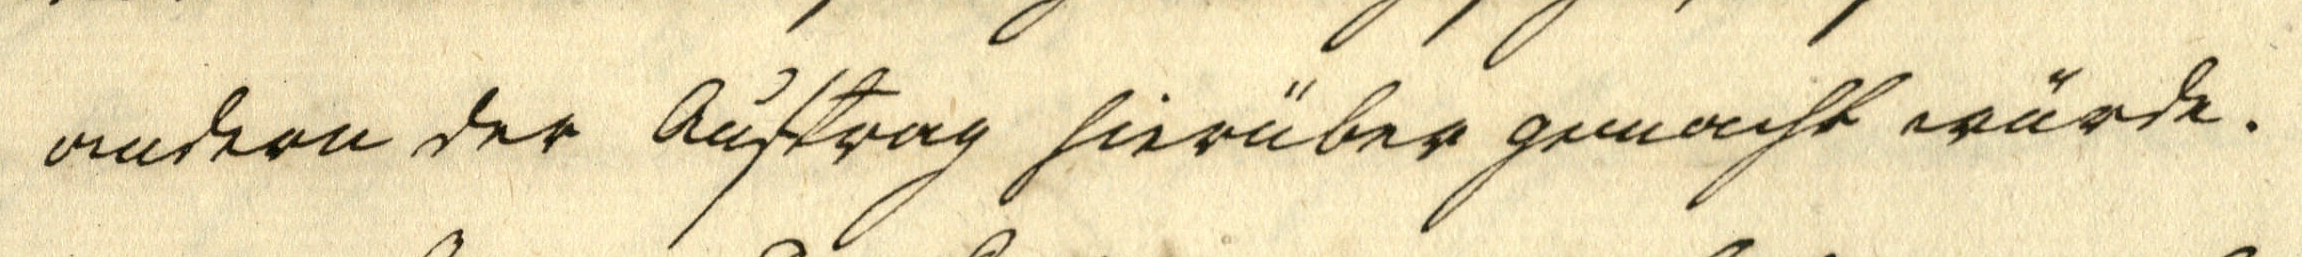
andern der Auftrag hierüber gemacht würde.
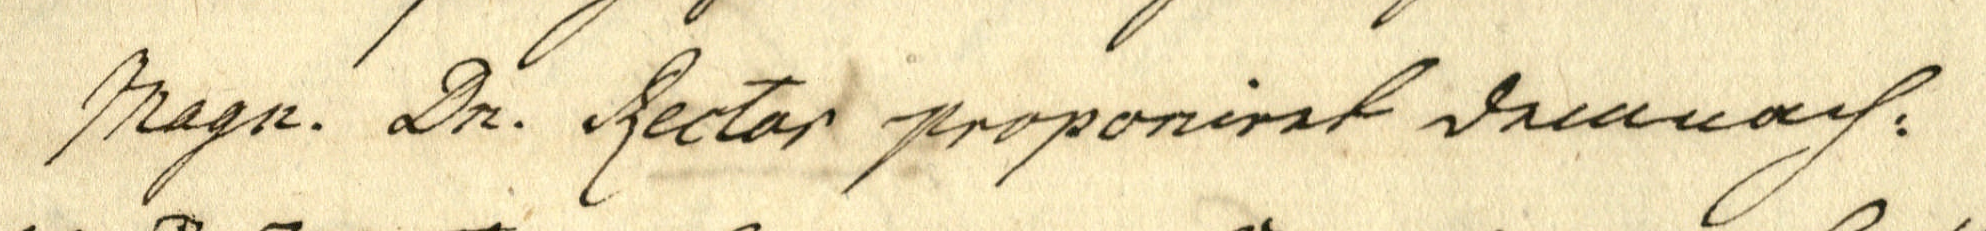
Magn. Dn. Rector proponiret demnach:
